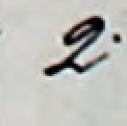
2
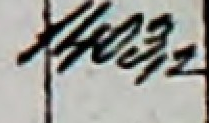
1403,2
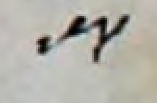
do
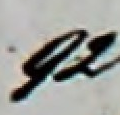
92
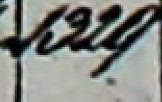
1329
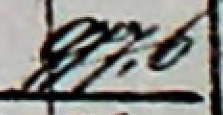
977,6
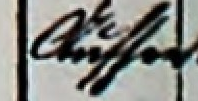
Aus„
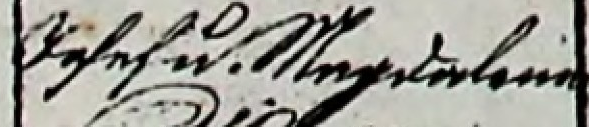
Josef u. Magdalena
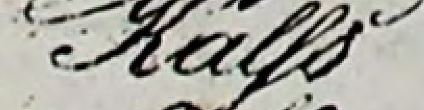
Kalfs
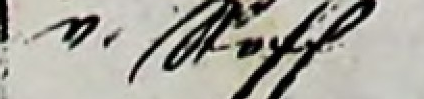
v. Stoff
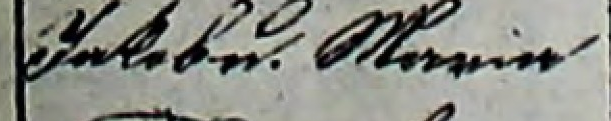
Jakob u. Maria
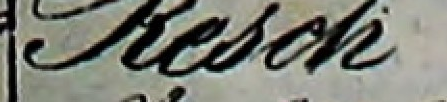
Resch
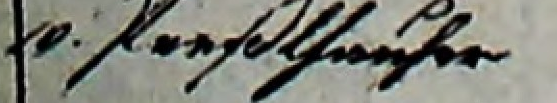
v. Preßlhauser
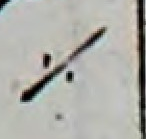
./.
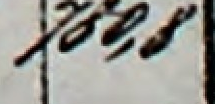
780,8
